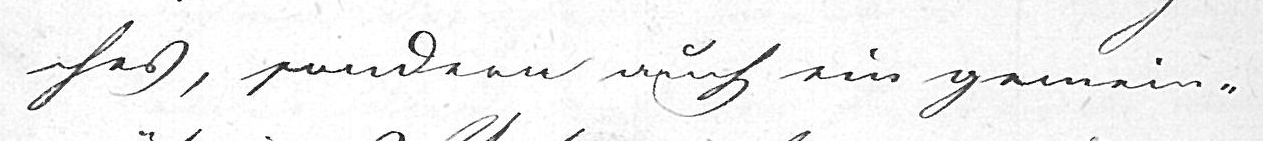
ches, sondern auch ein gemein-
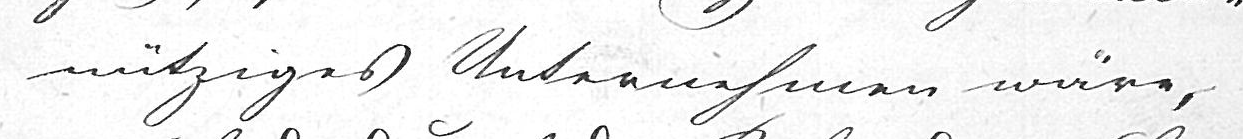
nütziges Unternehmen wäre,
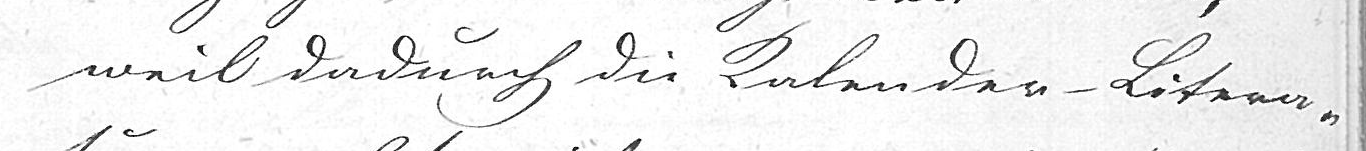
weil dadurch die Kalender-Litera-
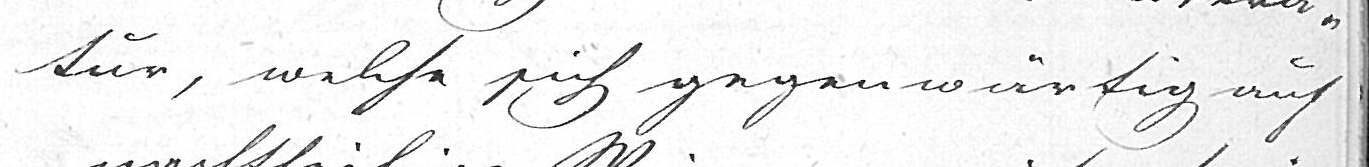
tur, welche sich gegenwärtig auf
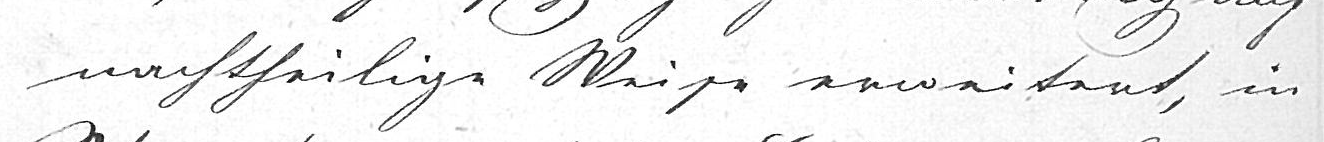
nachtheilige Weise erweitert, in
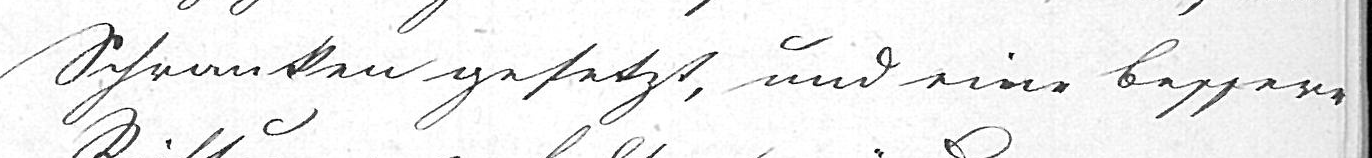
Schranken gesetzt, und eine bessers
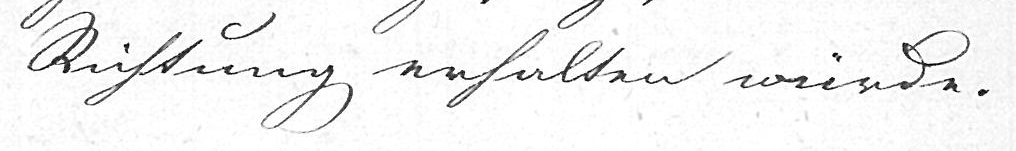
Richtung erhalten würde.
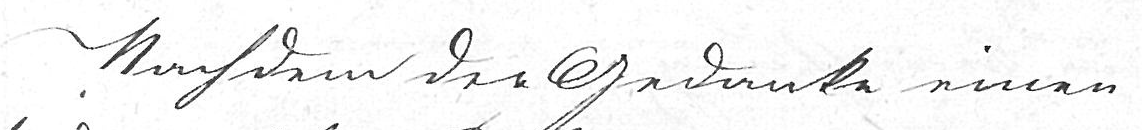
Nachdem der Gedanke einen
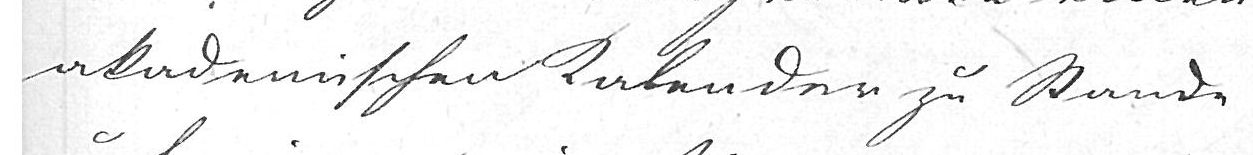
akademischen Kalender zu Stande
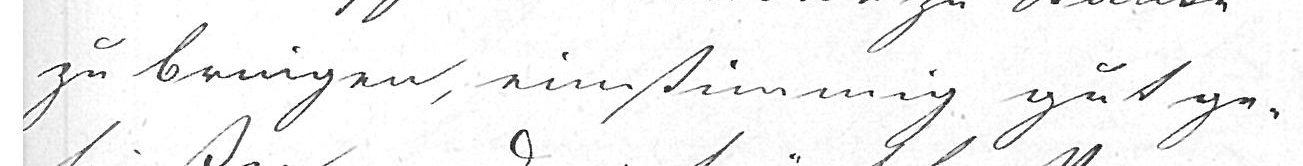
zu bringen einstimmig gut ge-
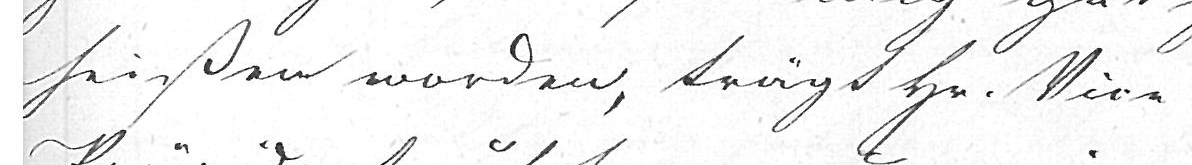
heißen worden, trägt Hr. Vice-
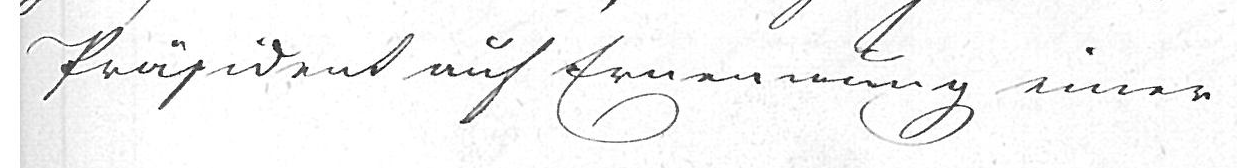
Präsident auf Ernennung einer
